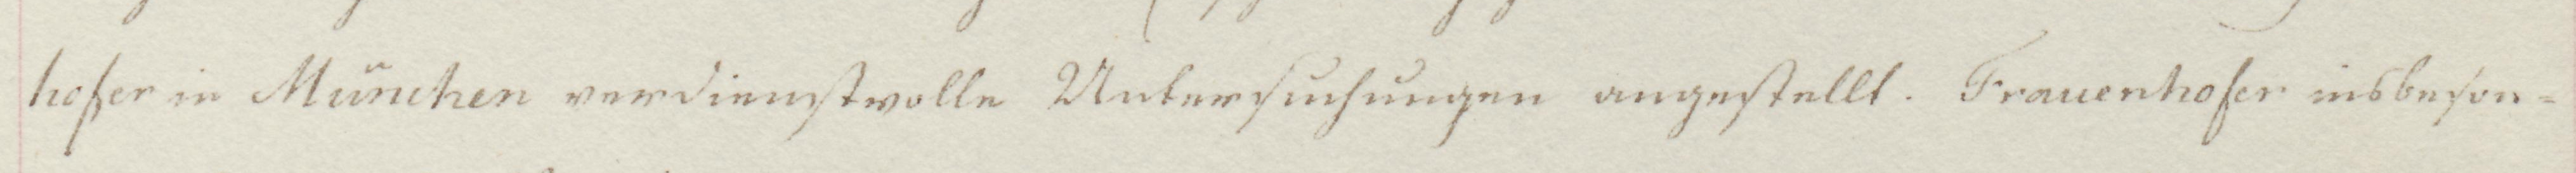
hofer in München verdienstvolle Untersuchungen angestellt. Frauenhofer insbeson-
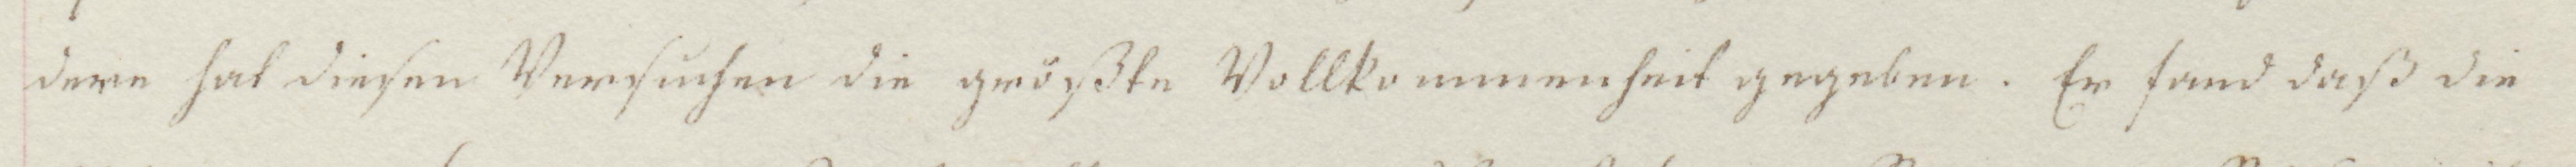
dere hat diesen Versuchen die größte Vollkommenheit gegeben. Er fand daß die
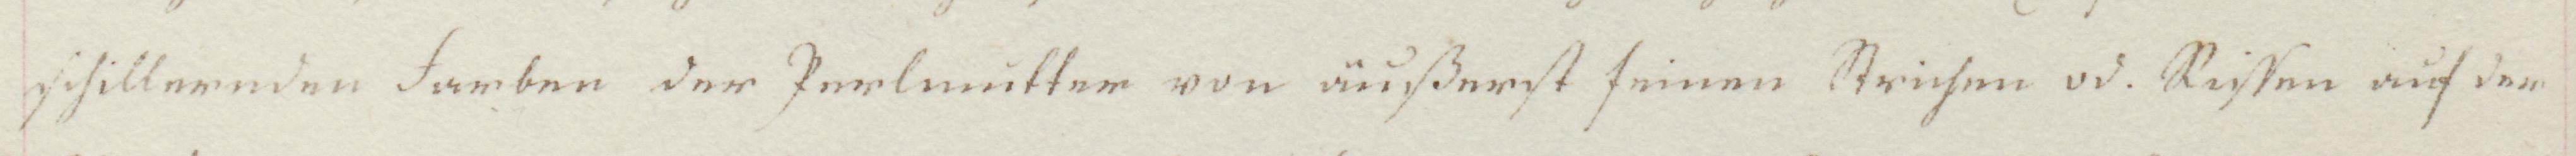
schillernden Farben der Perlmutter von äußerst feinen Strichen od. Rissen auf der
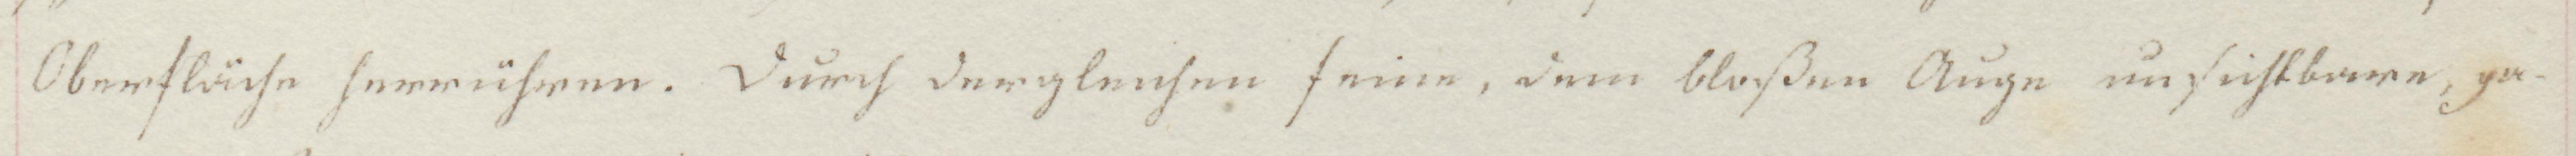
Oberfläche herrühren. Durch dergleichen feine, dem bloßen Auge unsichtbare, pa-
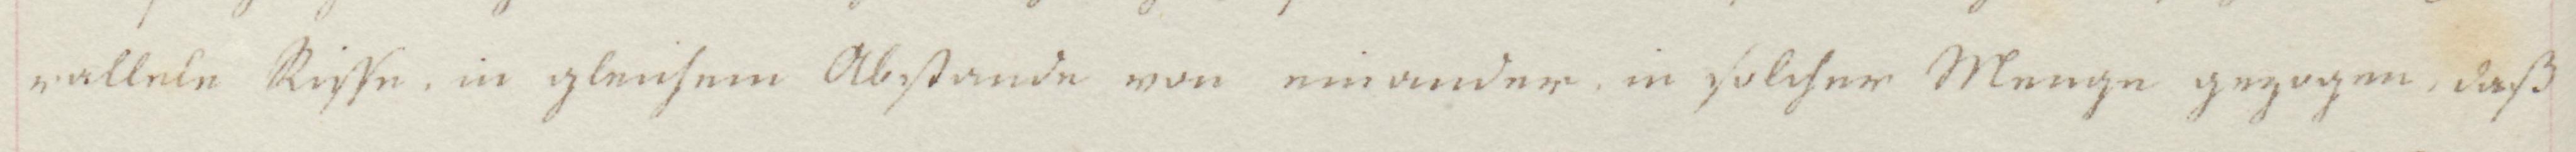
rallele Risse, in gleichem Abstande von einander, in solcher Menge gezogen, daß
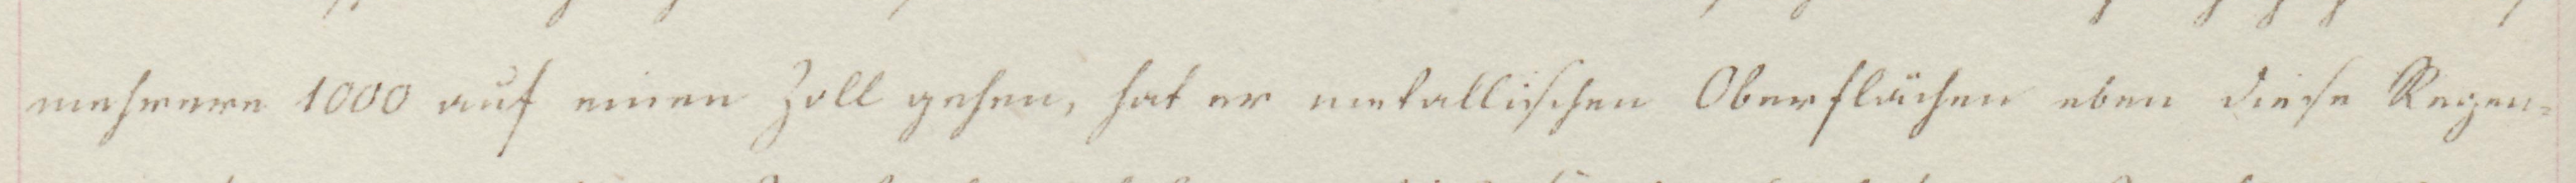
mehrere 1000 auf einen Zoll gehen, hat er metallischen Oberflächen eben diese Regen-
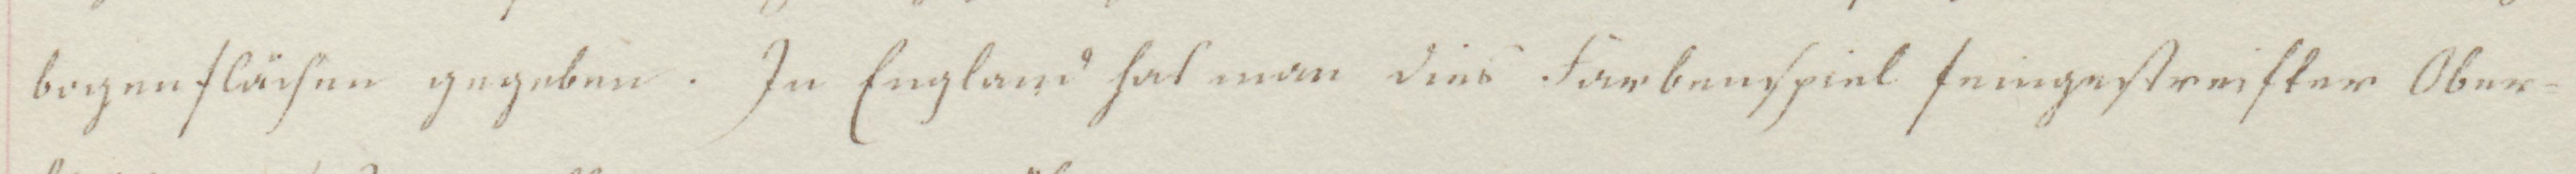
bogenflächen gegeben. In England hat man dies Farbenspiel feingestreifter Ober-
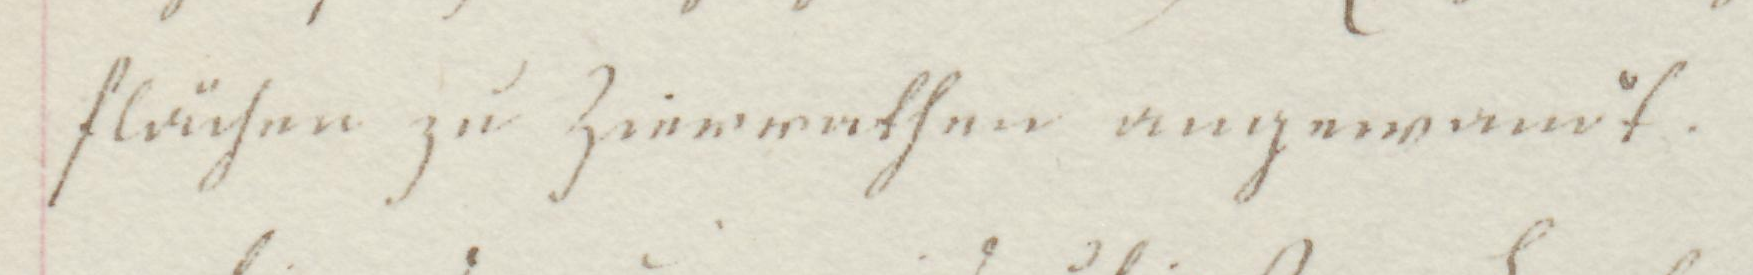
flächen zu Zierrathen angewandt.
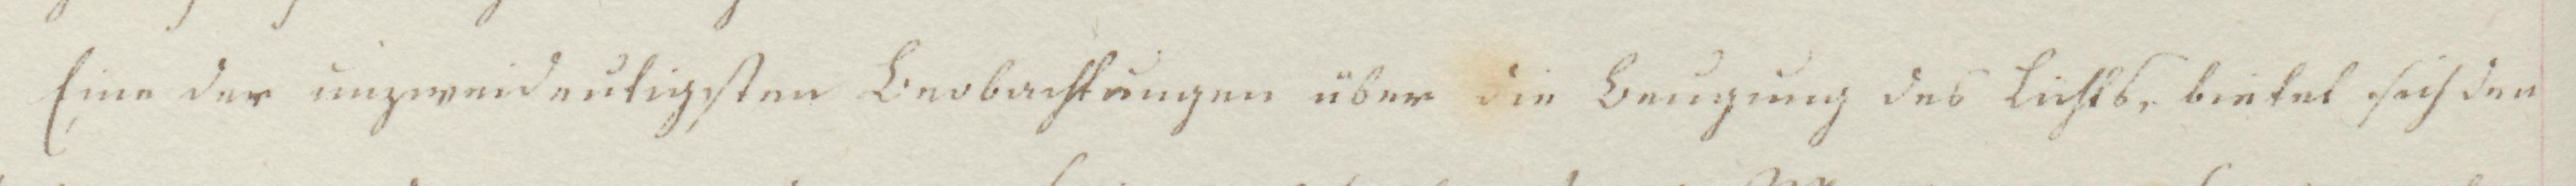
Eine der unzweideutigsten Beobachtungen über die Beugung des Lichts, bietet sich den
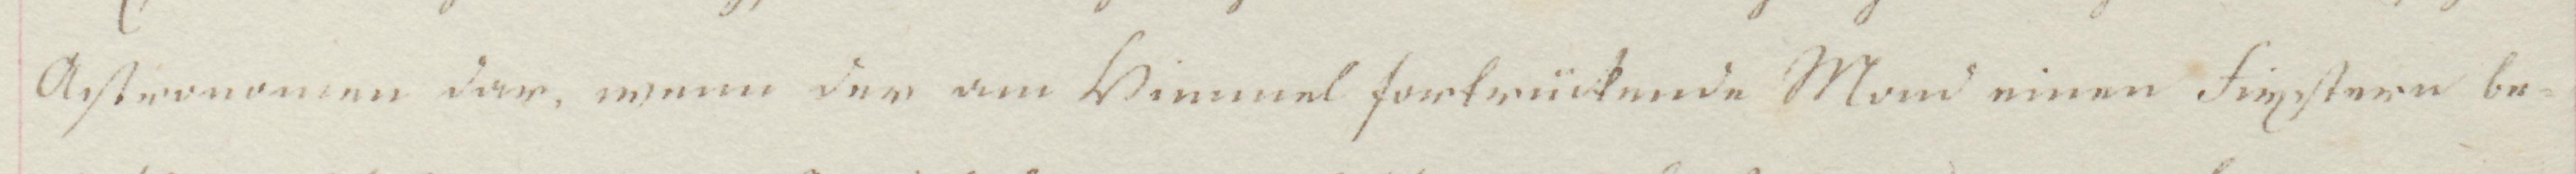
Astronomen dar, wenn der am Himmel fortrückende Mond einen Fixstern be-
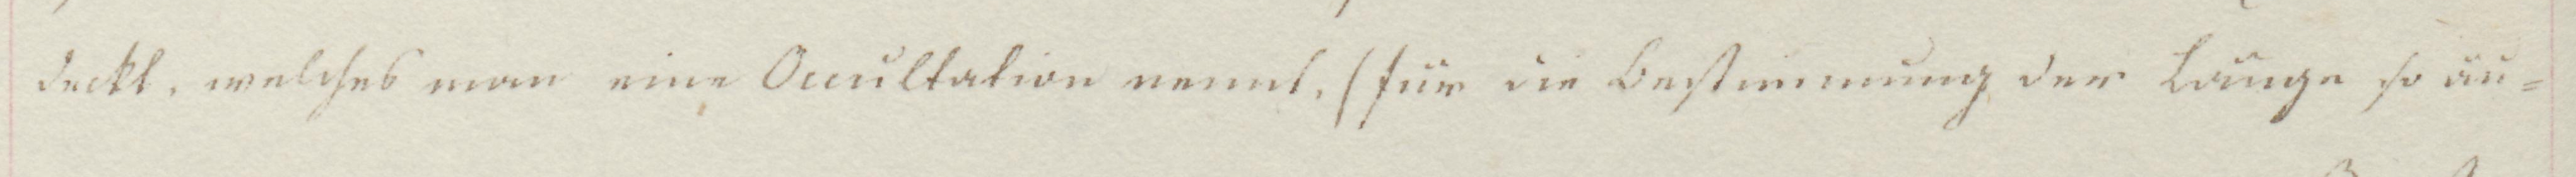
deckt, welches man eine Occultation nennt, (für die Bestimmung der Länge so äu-
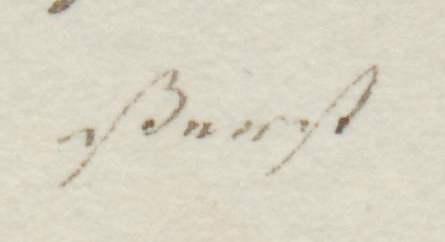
ßerst
